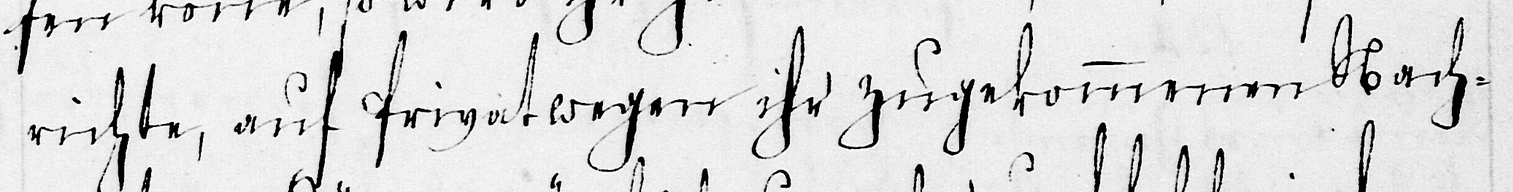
richte, auf Privatwegen ihr zugekommenen Nach¬
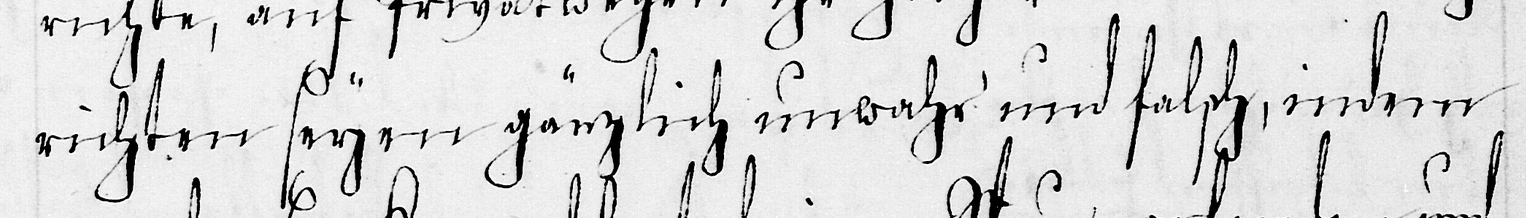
richten seyen gänzlich unwahr und falsch, indem
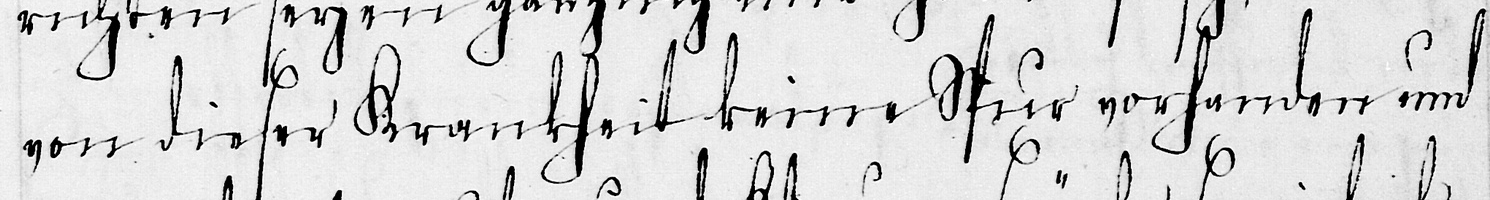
von dieser Krankheit keine Spur vorhanden und
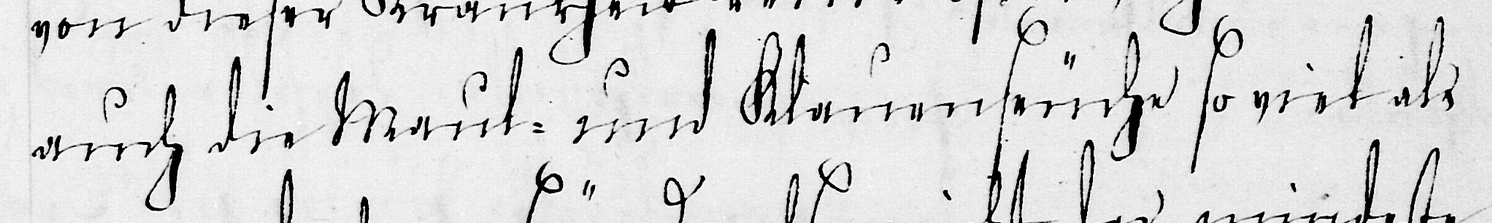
auch die Maul- und Klauenseuche so viel als
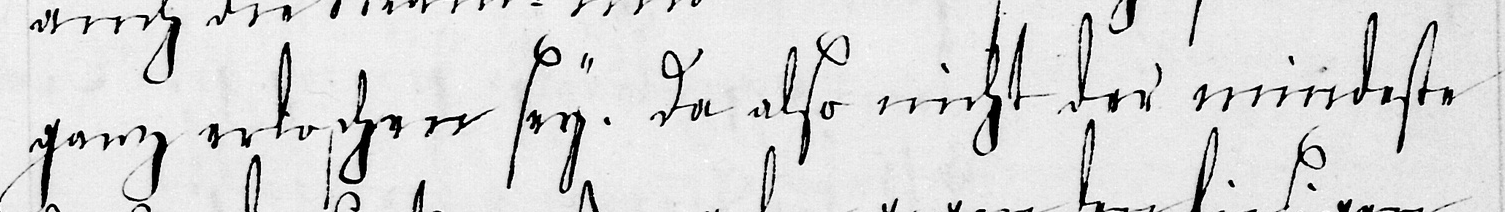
ganz erloschen sey. Da also nicht der mindeste
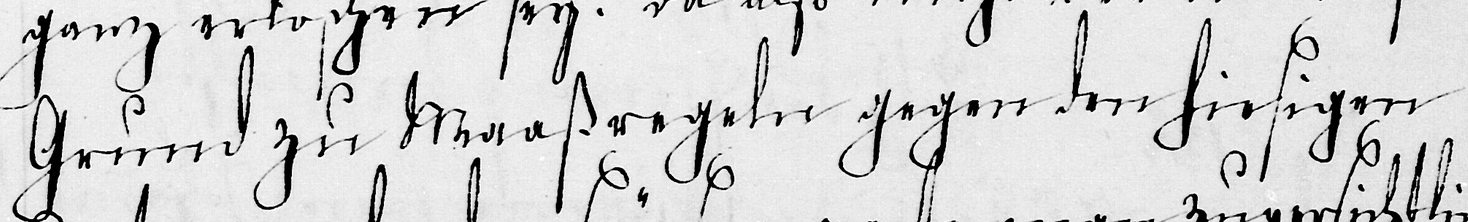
Grund zu Maaßregeln gegen den hiesigen
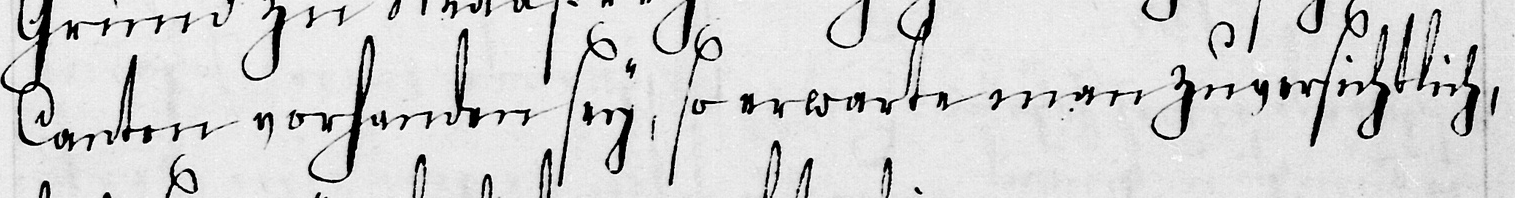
Canton vorhanden sey, so warte man zuversichtlich,
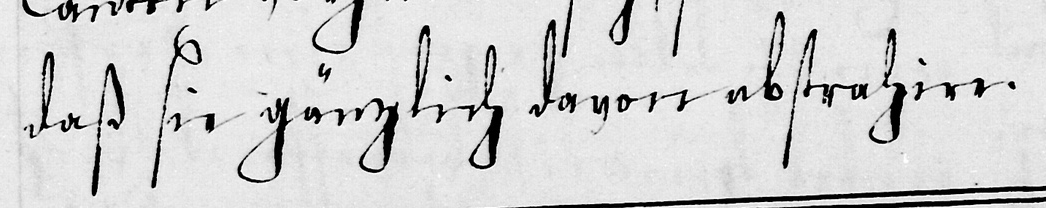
daß sie gänzlich davon abstrahire.
